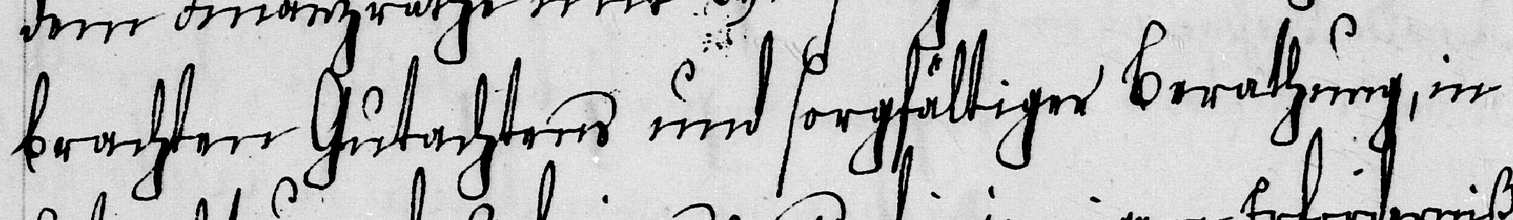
brachten Gutachtens und sorgfältiger Berathung, in
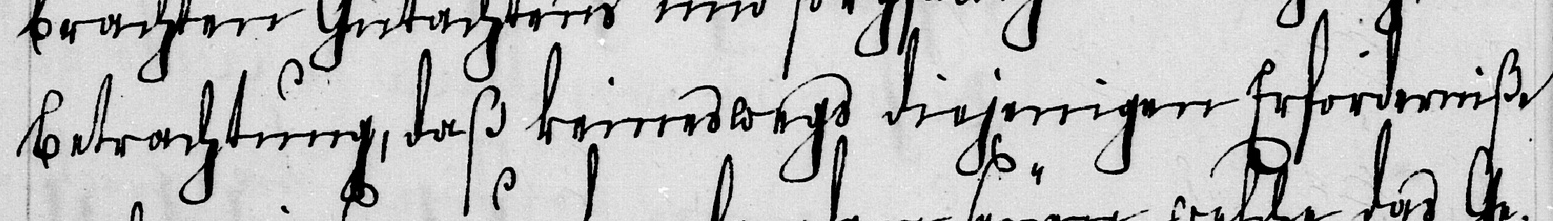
Betrachtung, daß keineswegs diejenigen Erforderniße
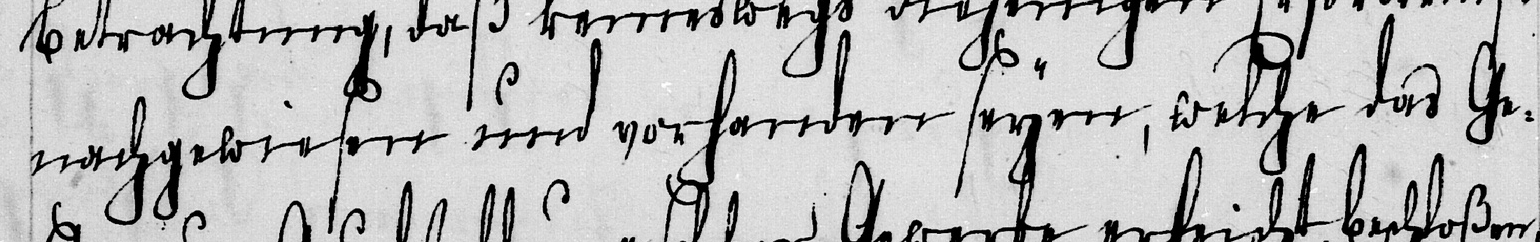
nachgewiesen und vorhanden seyen, welche das Ge¬
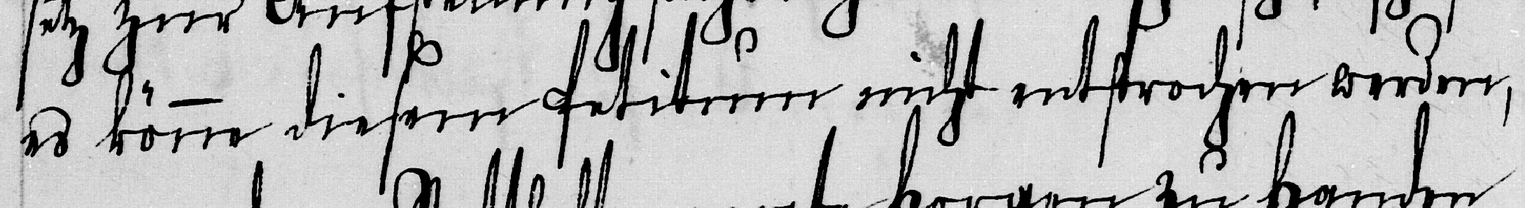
es könne diesem Petitum nicht entsprochen werden,
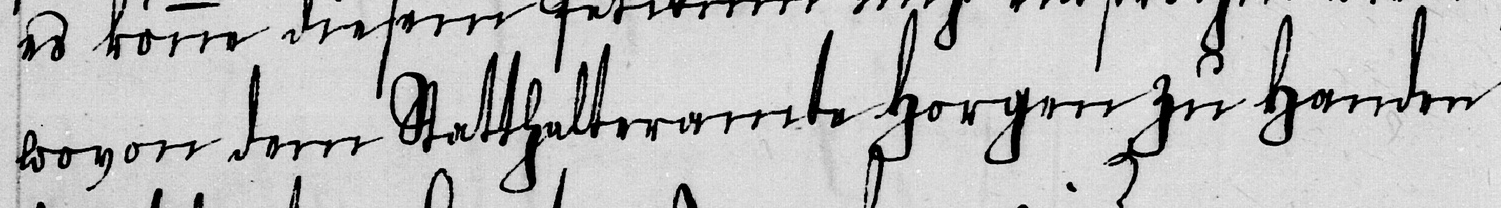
wovon dem Statthalteramte Horgen zu Handen
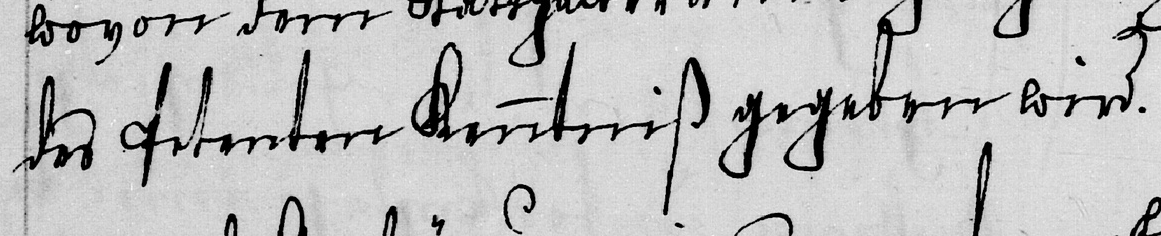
des Petanten Kenntniß gegeben wird.
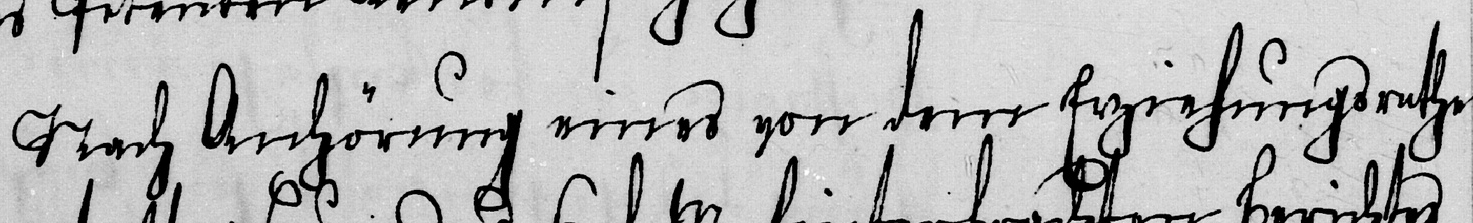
Nach Anhörung eines von dem Erziehungsrathe
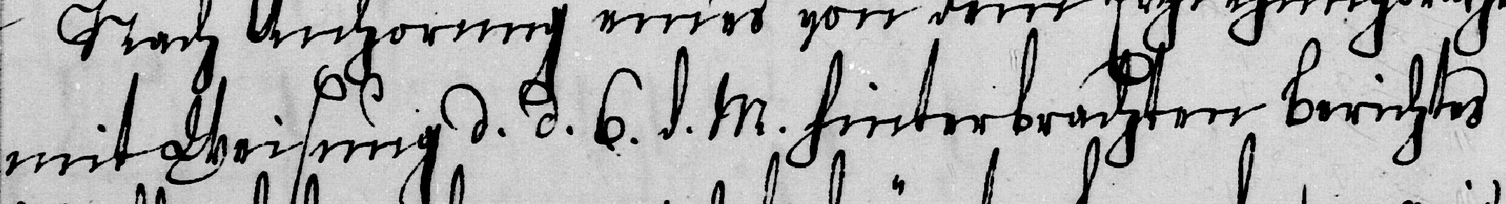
mit Weisung d. d. 6. d. M. hinterbrachten Berichtes
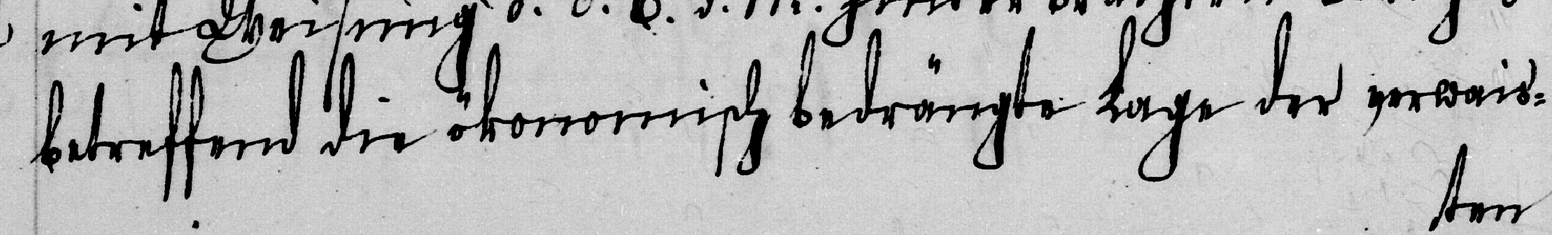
betreffend die ökonomisch bedrängte Lage der verwais-
